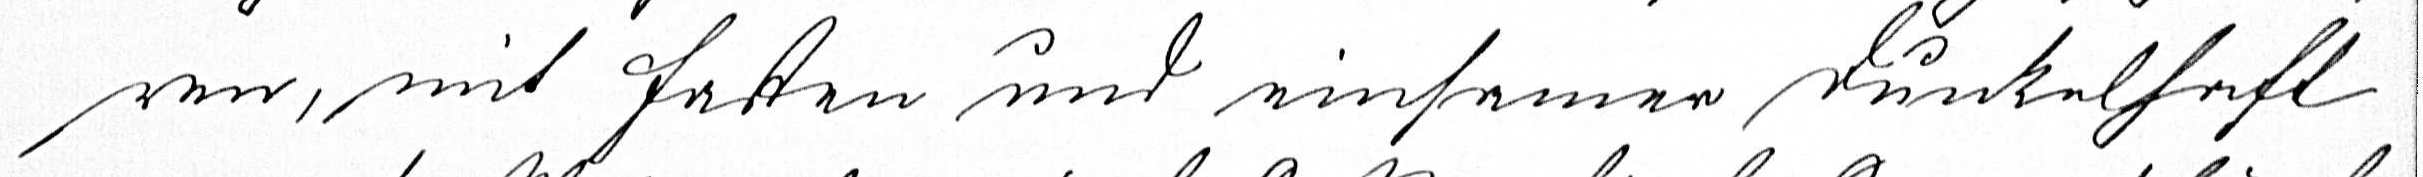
ren, mit Fasten und einsamer Dunkelhaft
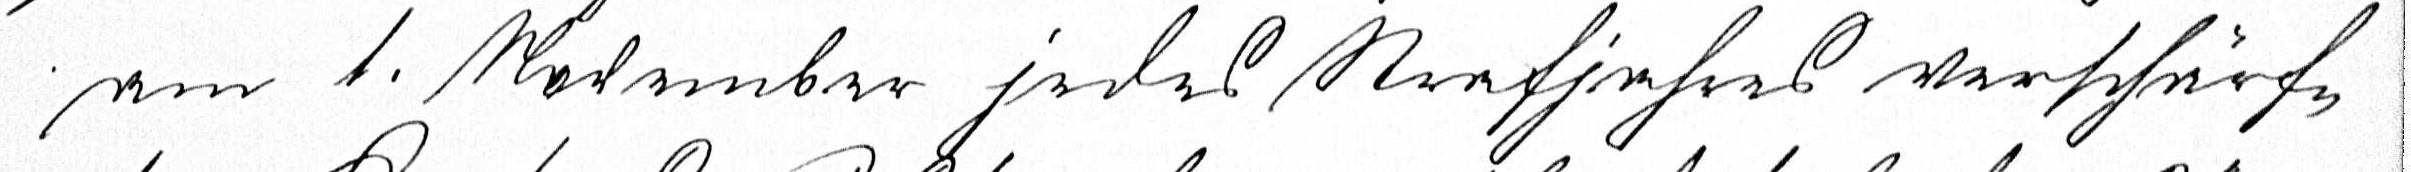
am 1. November jedes Strafjahres verschärf¬
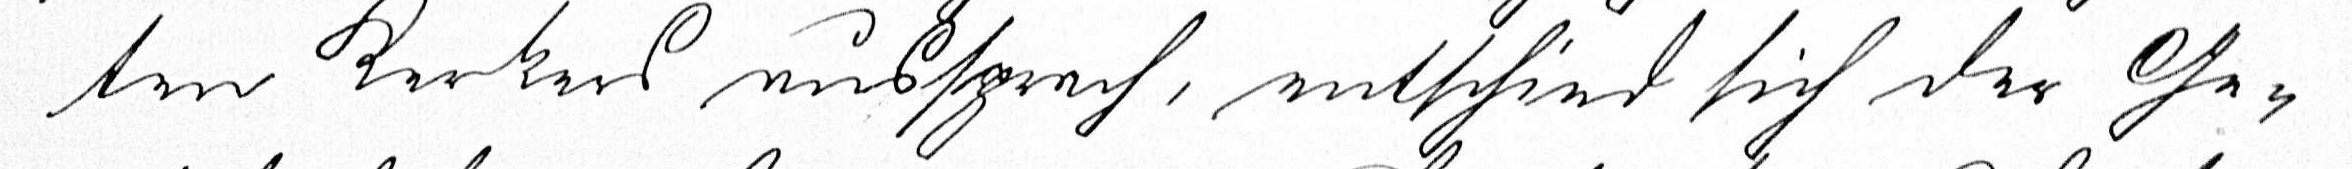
ten Kerkers aussprach, enthschied sich der Ge¬
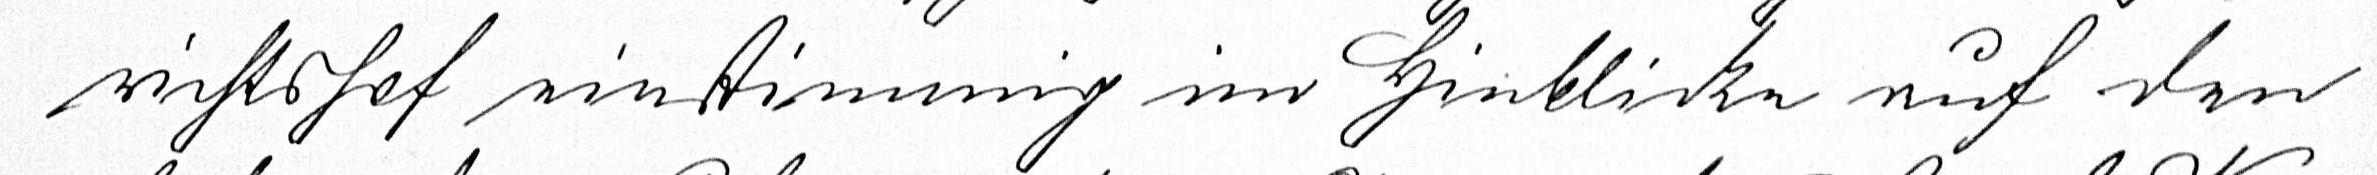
richtshof einstimmig im Hinblicke auf den
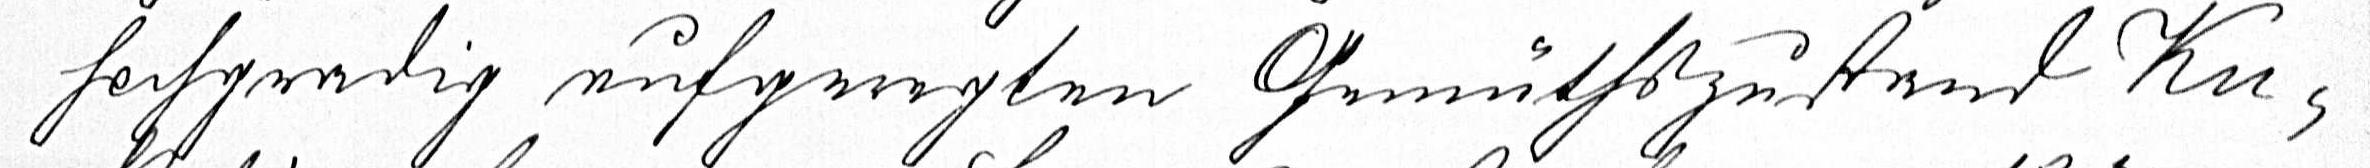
hochgradig aufgerechten Gemüthszustand Ku¬
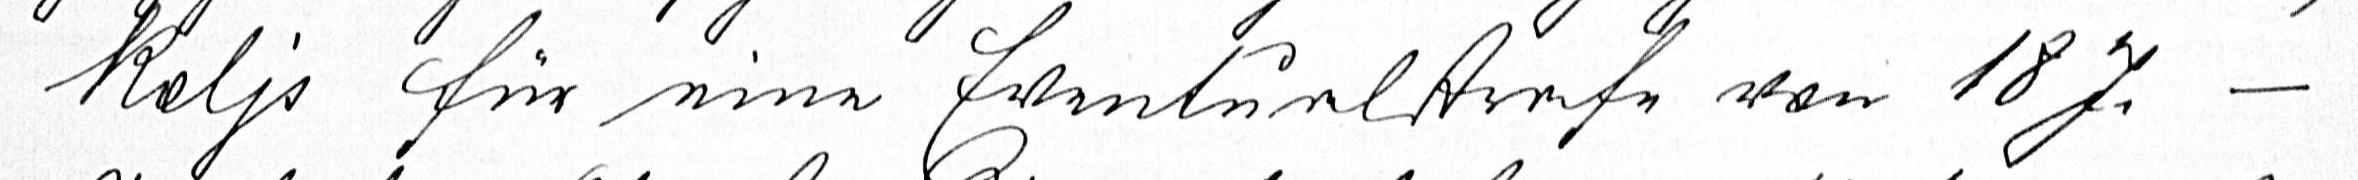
koljs für eine Eventuealstrafe vom 18J. –
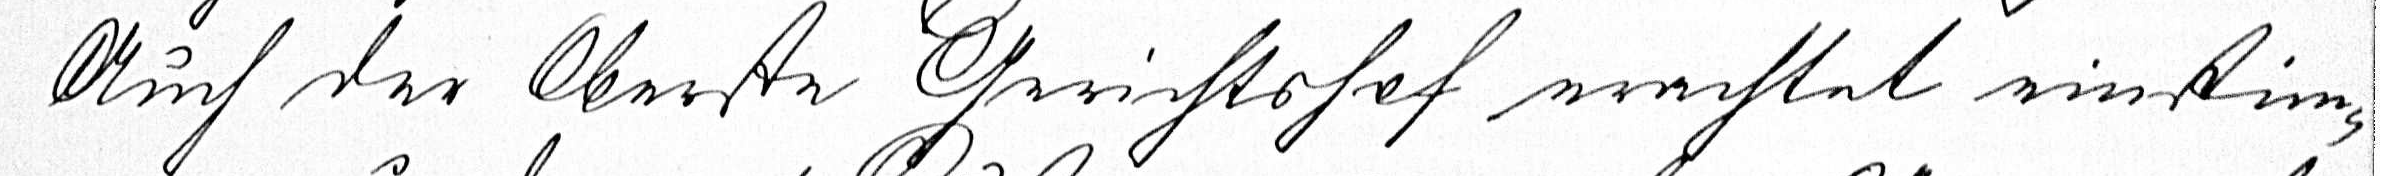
Auch der Oberste Gerichtshof erachtet einstim¬
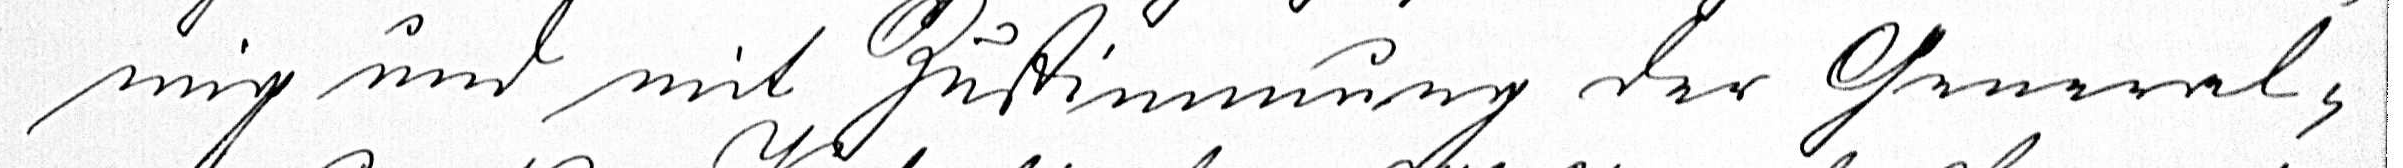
mig und mit Zustimmung der General¬
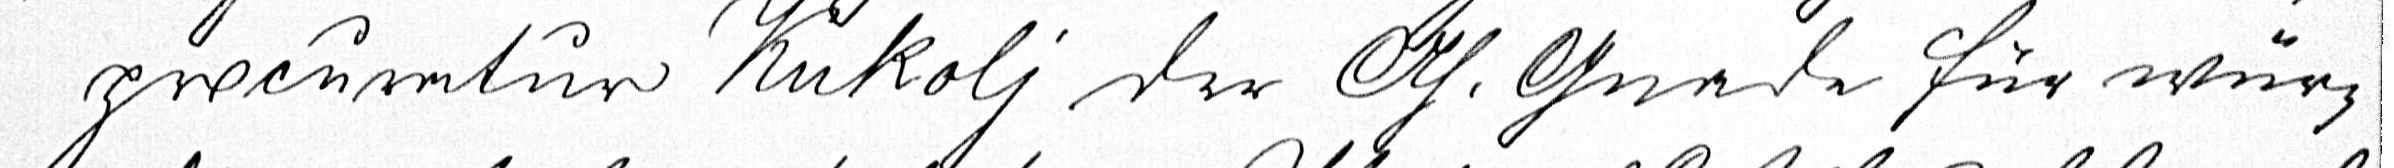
procuratur Kukolj der Ah. Gnade für wür¬
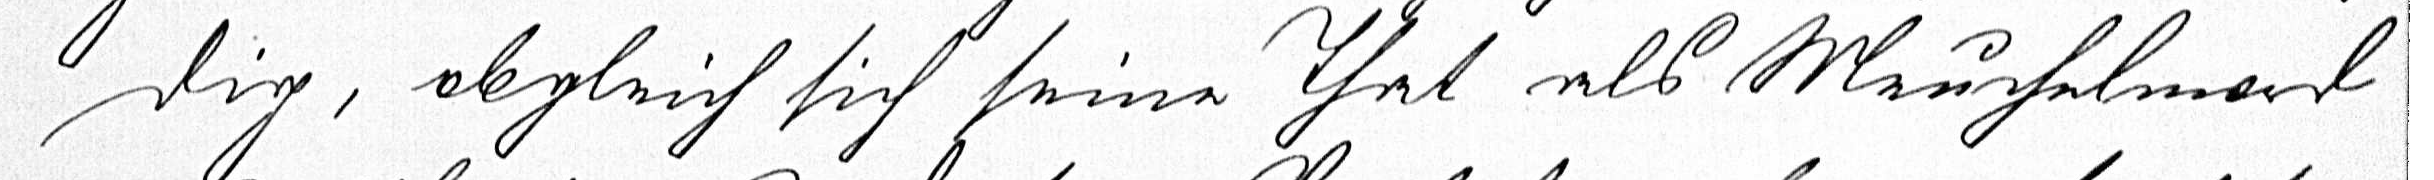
dig, obgleich sich seine That als Meuchelmord
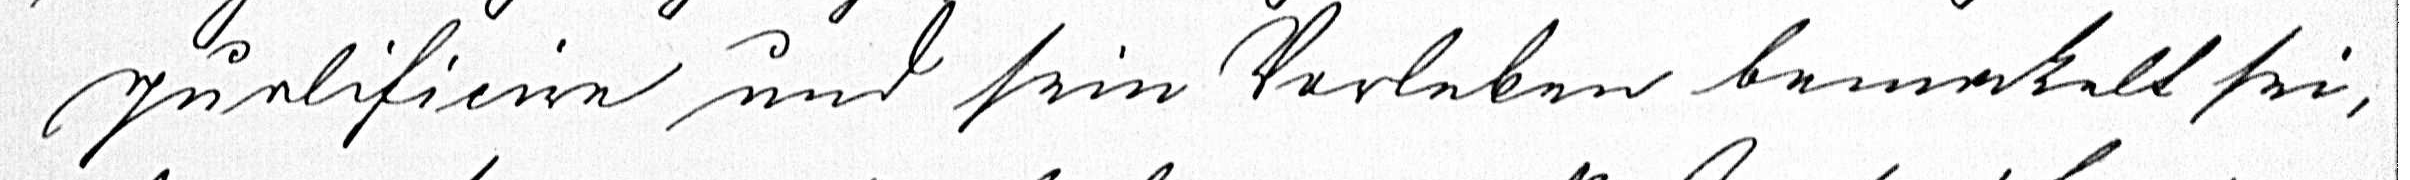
qualificire und sein Vorleben bemakelt sei,
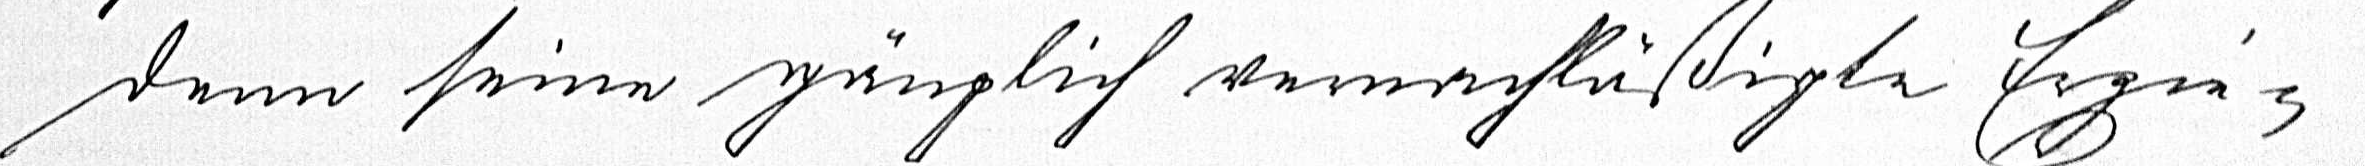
denn seine gänzlich vernachläßigte Erzie¬
